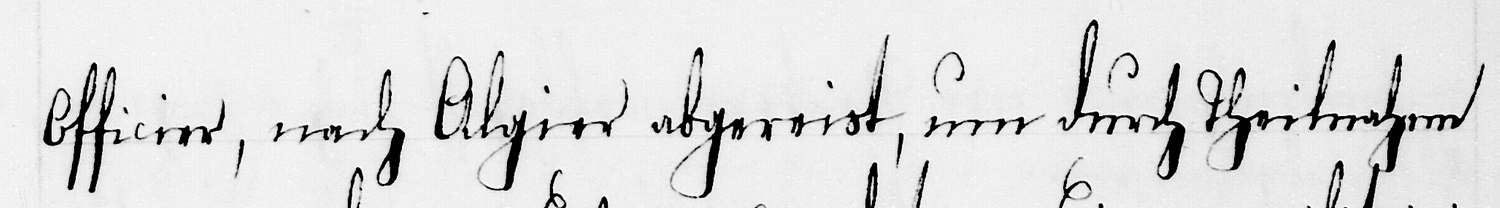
Officier, nach Algier abgereist, um durch Theilnahme
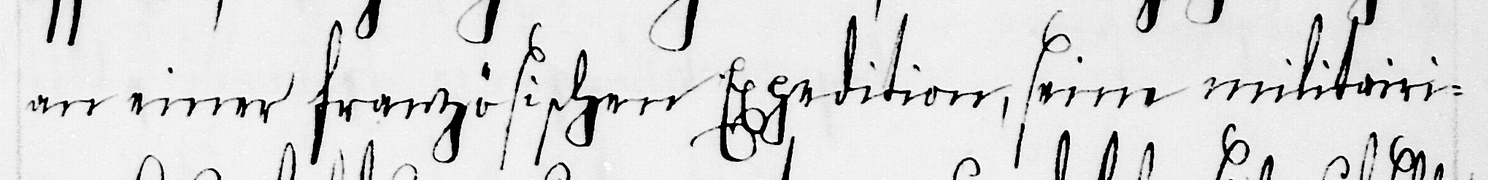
an einer französischen Expedition, seine militairi¬
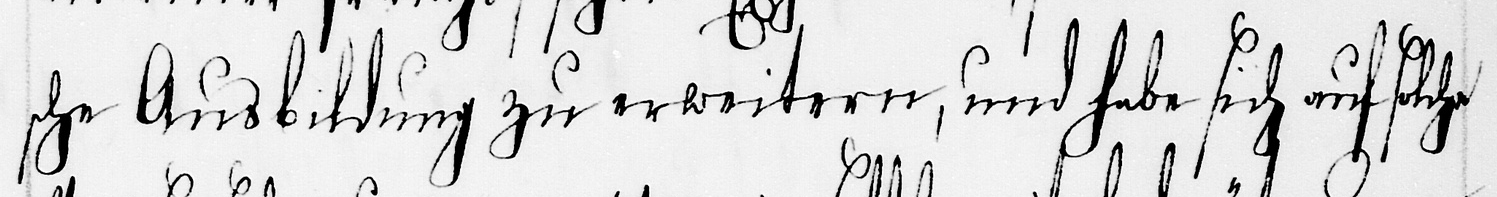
sche Ausbildung zu erweitern, und habe sich auf sol¬
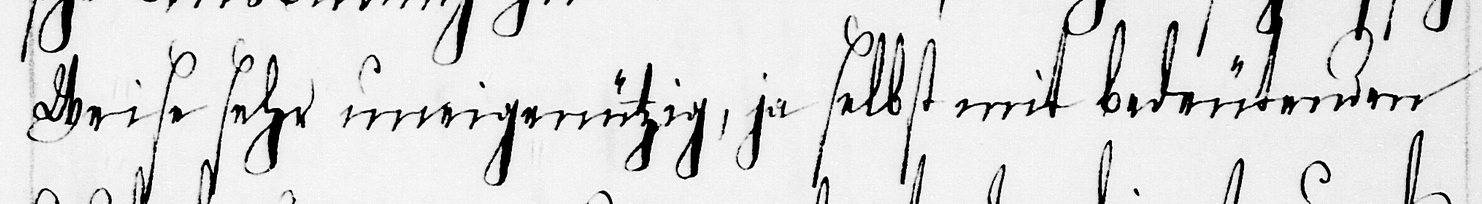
Weise sehr uneigenützig, ja selbst mit bedeutenden
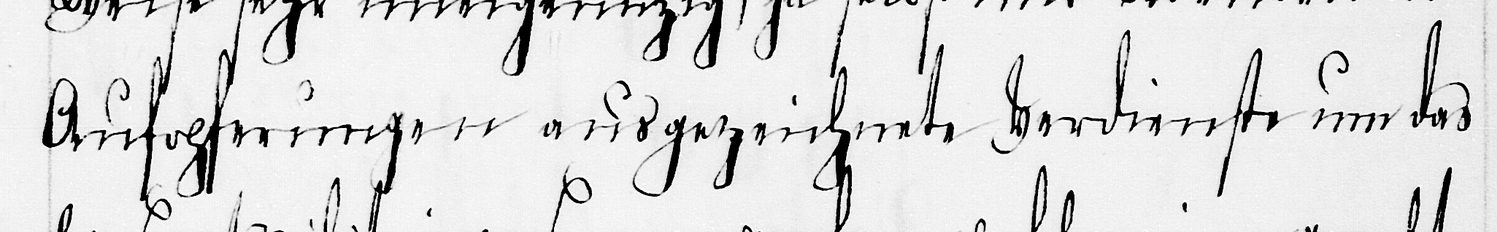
Aufopferungen ausgezeichnete Verdienste um das
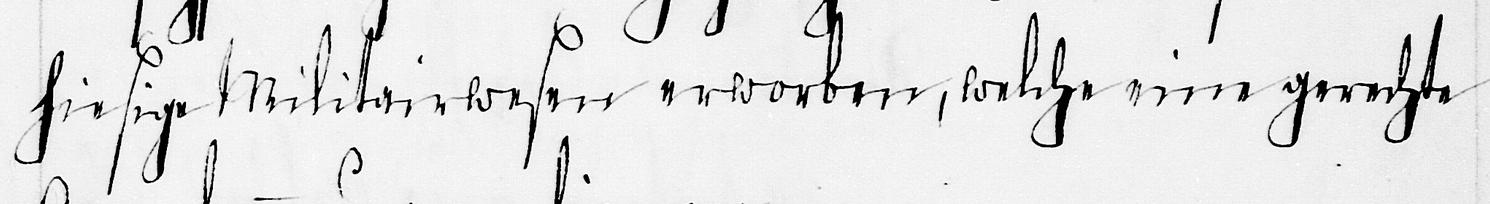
hiesige Militairwesen erworben, welche eine gerechte
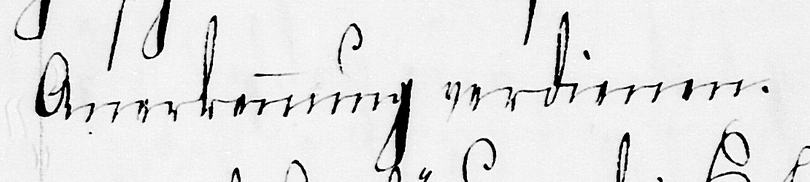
Anerkennung verdienen.
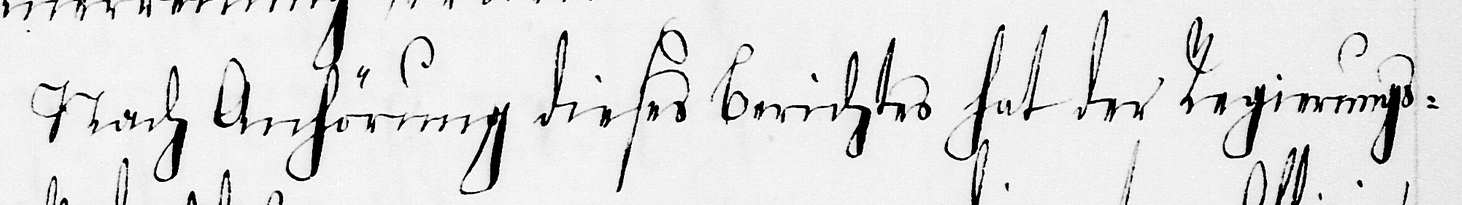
Nach Anhörung dieses Berichtes hat der Regierungs¬
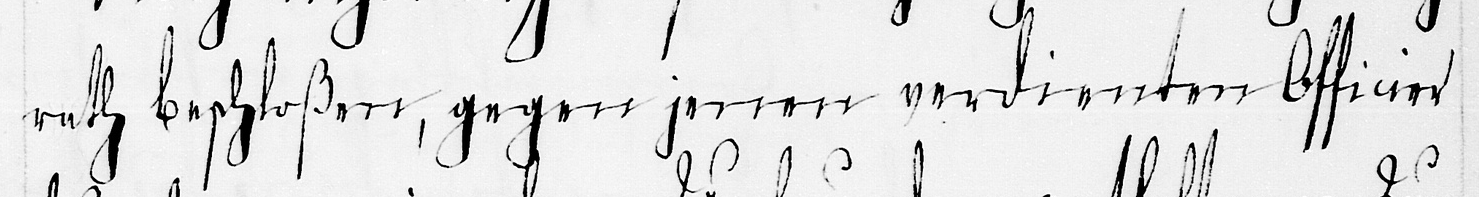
rath beschloßen, gegen jenen verdienten Officier
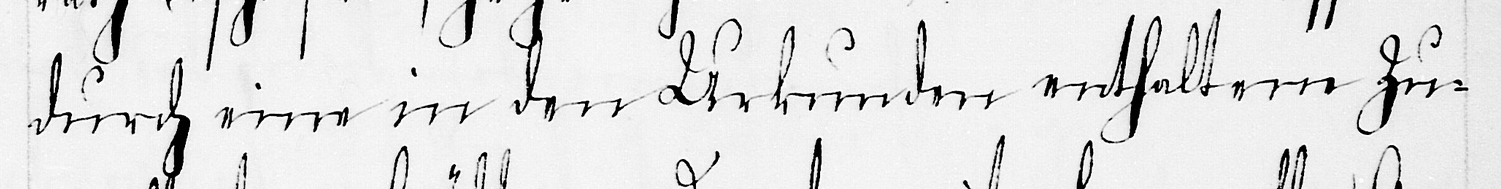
durch eine in den Urkunden enthaltene Zu¬
